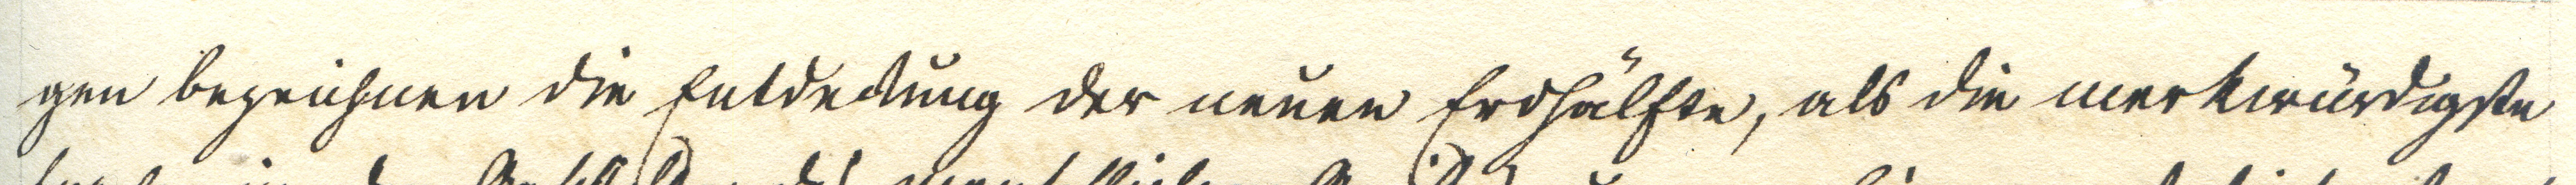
gen bezeichnen die Entdeckung der neuen Erdhälfte, als die merkwürdigste
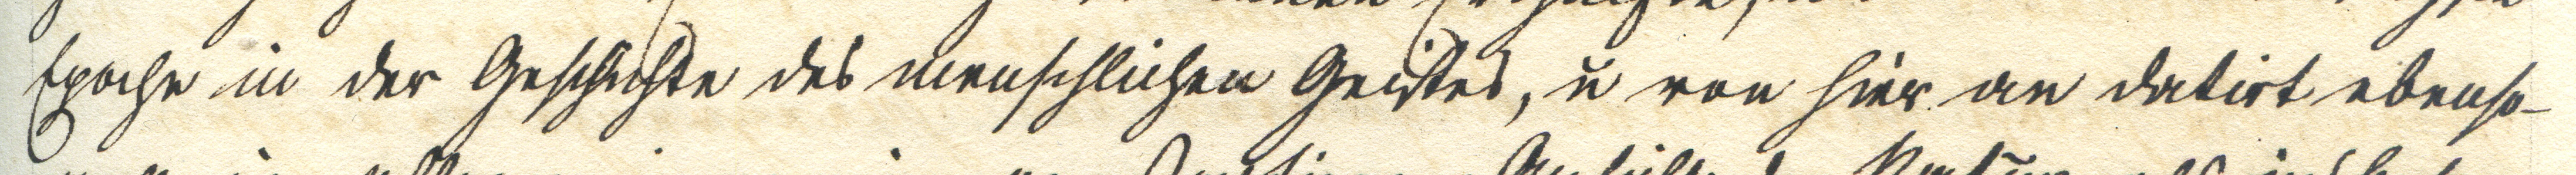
Epoche in der Geschichte des menschlichen Geistes, u von hier an datirt ebenso-
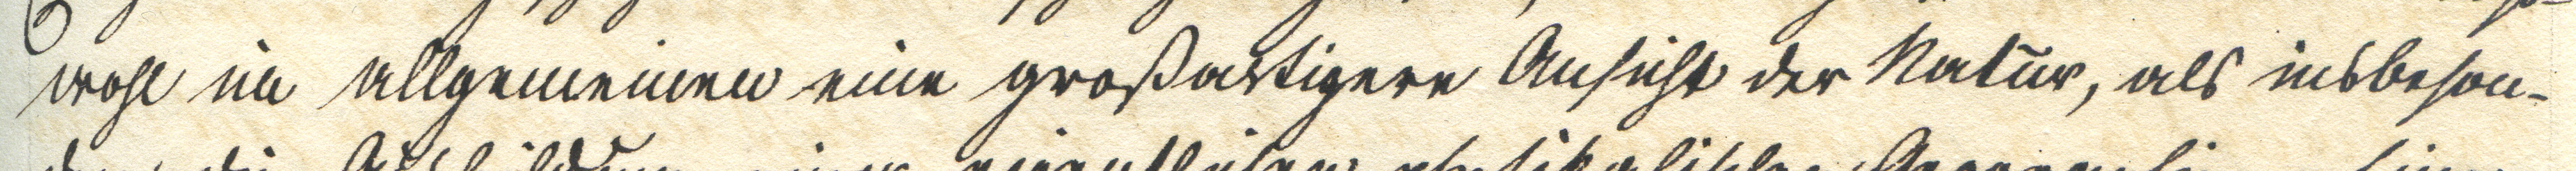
wohl im allgemeinen eine großartigere Ansicht der Natur, als insbeson-
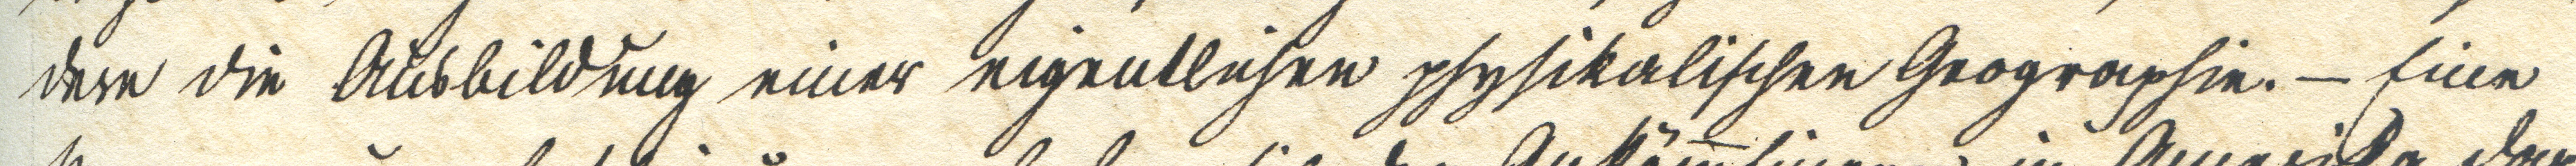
dere die Ausbildung einer eigentlichen physikalischen Geographie. – Eine
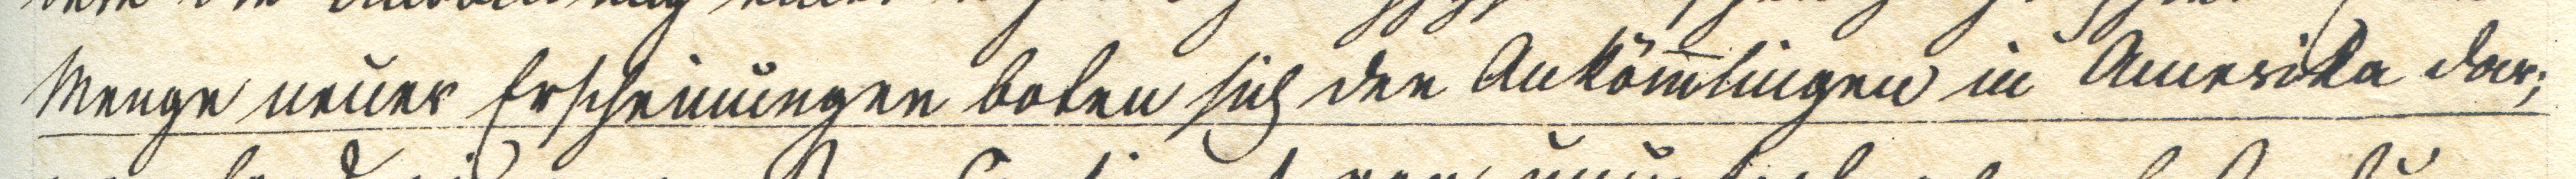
Menge neuer Erscheinungen boten sich den Anköm̃lingen in Amerika dar;
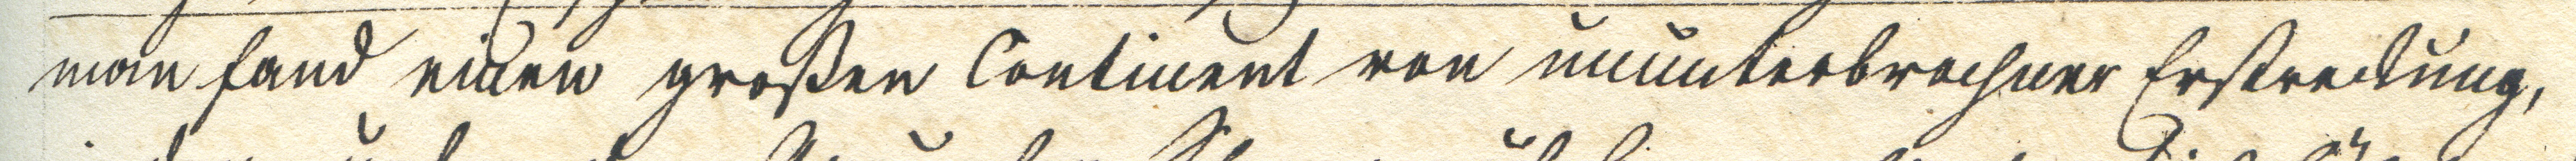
man fand einen großen Continent von ununterbrochner Erstreckung,
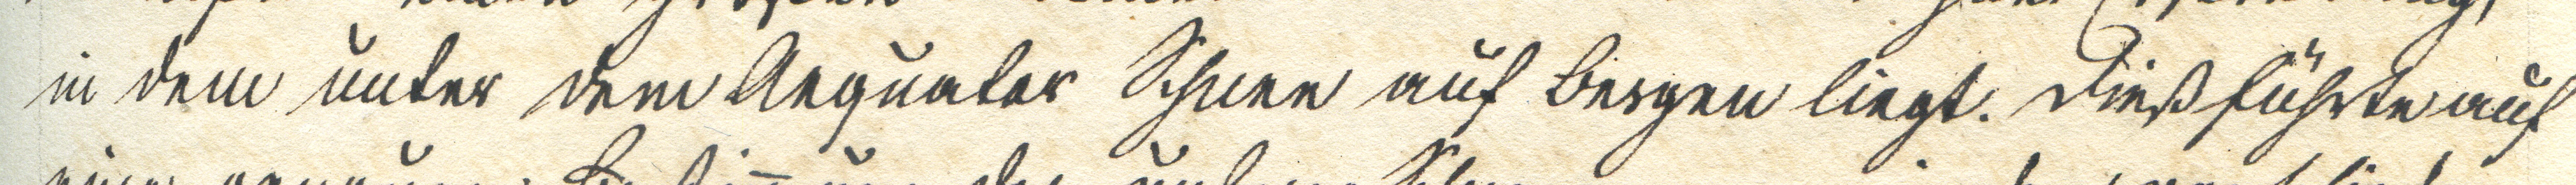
in dem unter dem Aequator Schnee auf Bergen liegt. Dieß führte auf
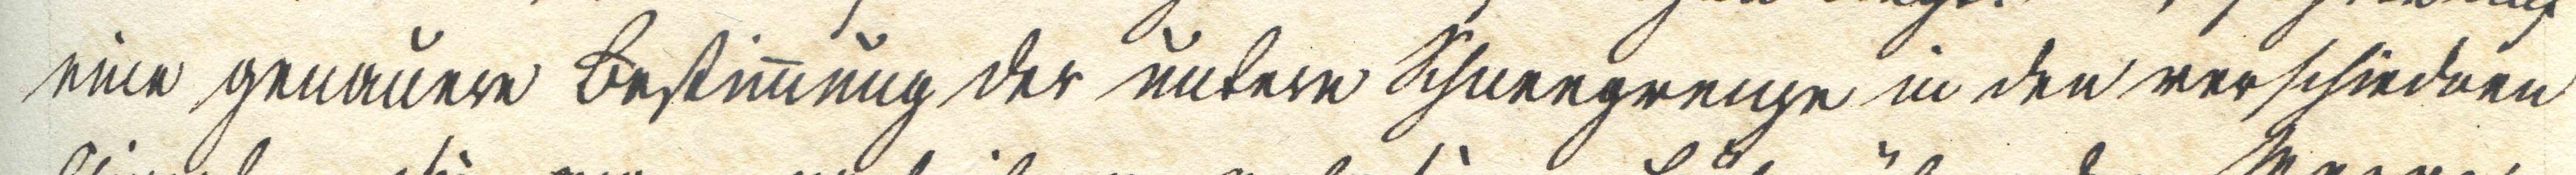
eine genauere Bestim̃ung der untern Schneegrenze in den verschiedenen
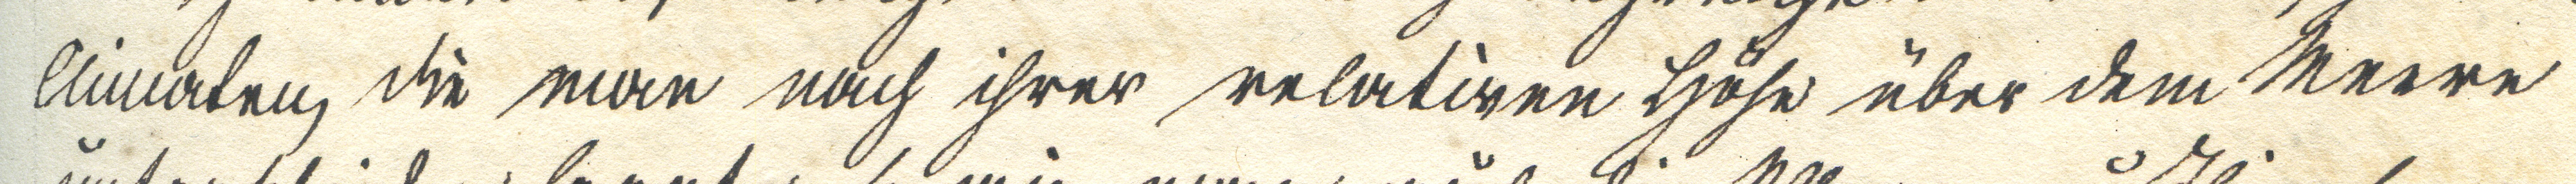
Climaten, die man nach ihrer relativen Höhe über dem Meere
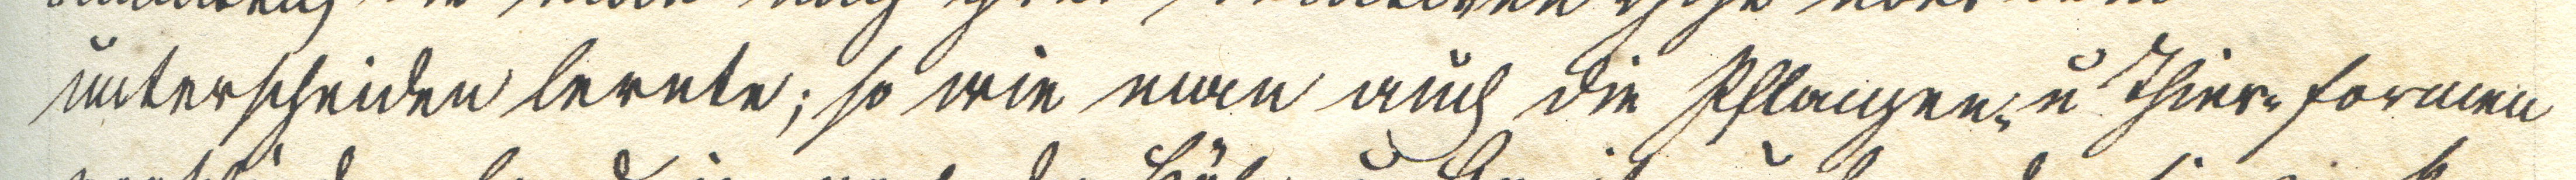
unterscheiden lernte; so wie man auch die Pflanzen- u Thier-formen
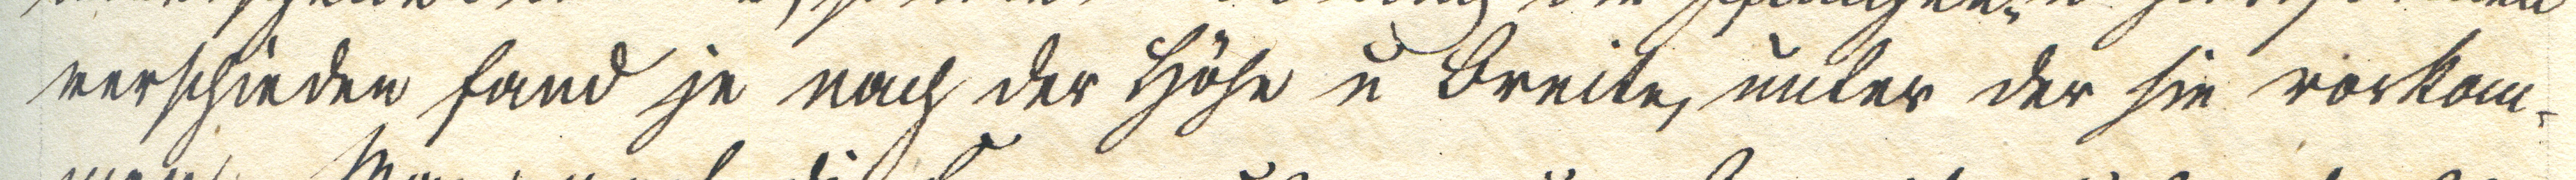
verschieden fand je nach der Höhe u Breite, unter der sie vorkom-
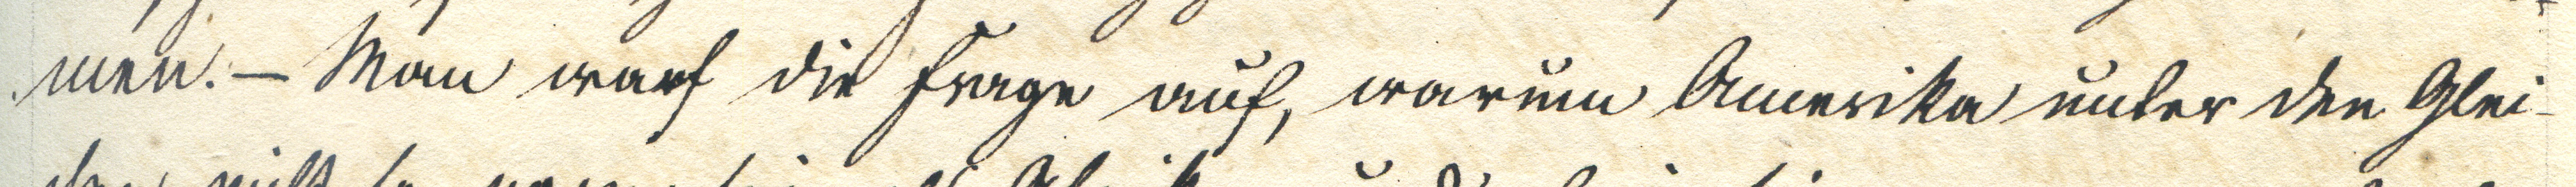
men. – Man warf die Frage auf, warum Amerika unter den Glei-
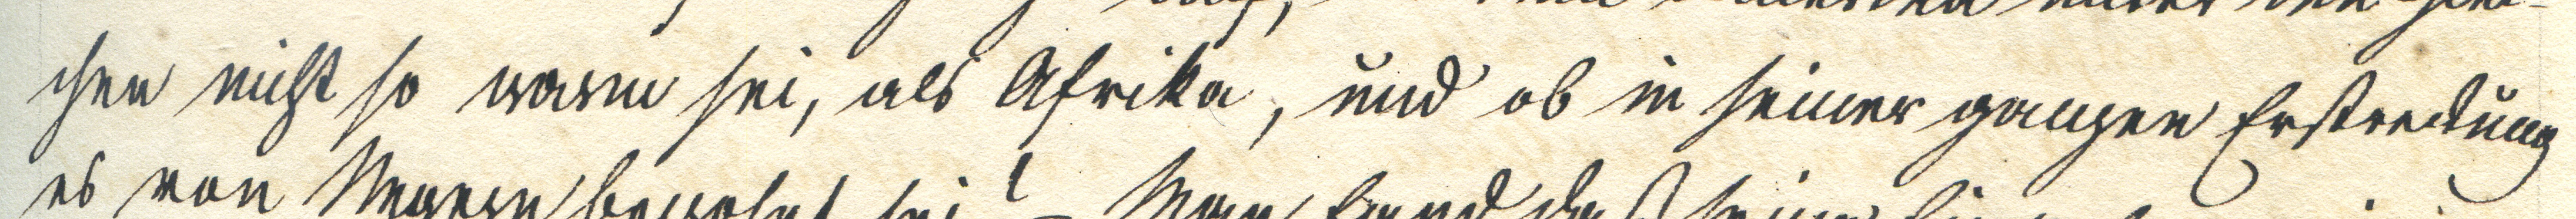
chen nicht so warm sei, als Afrika, und ob in seiner ganzen Erstreckung
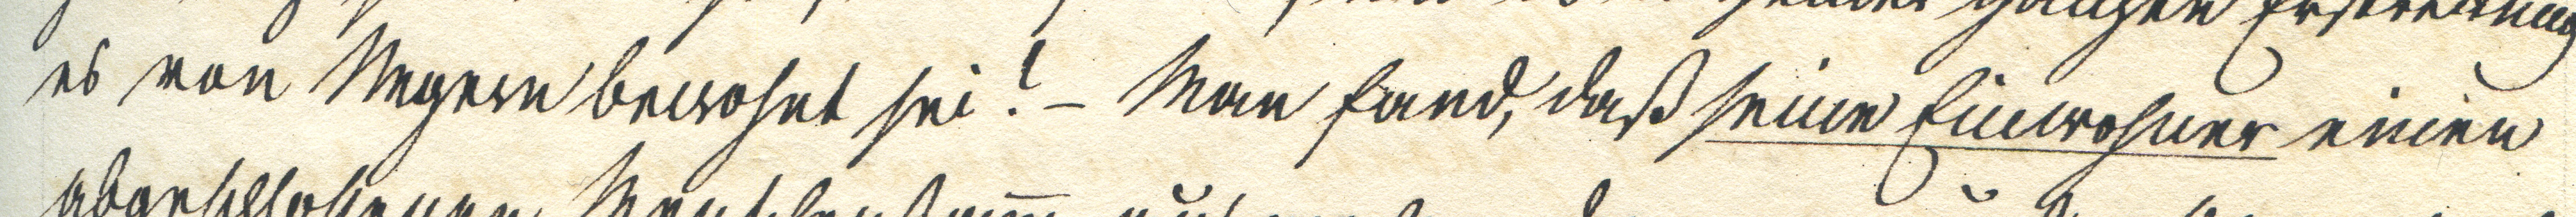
es von Negern bewohnt sei? – Man fand, daß seine Einwohner einen
